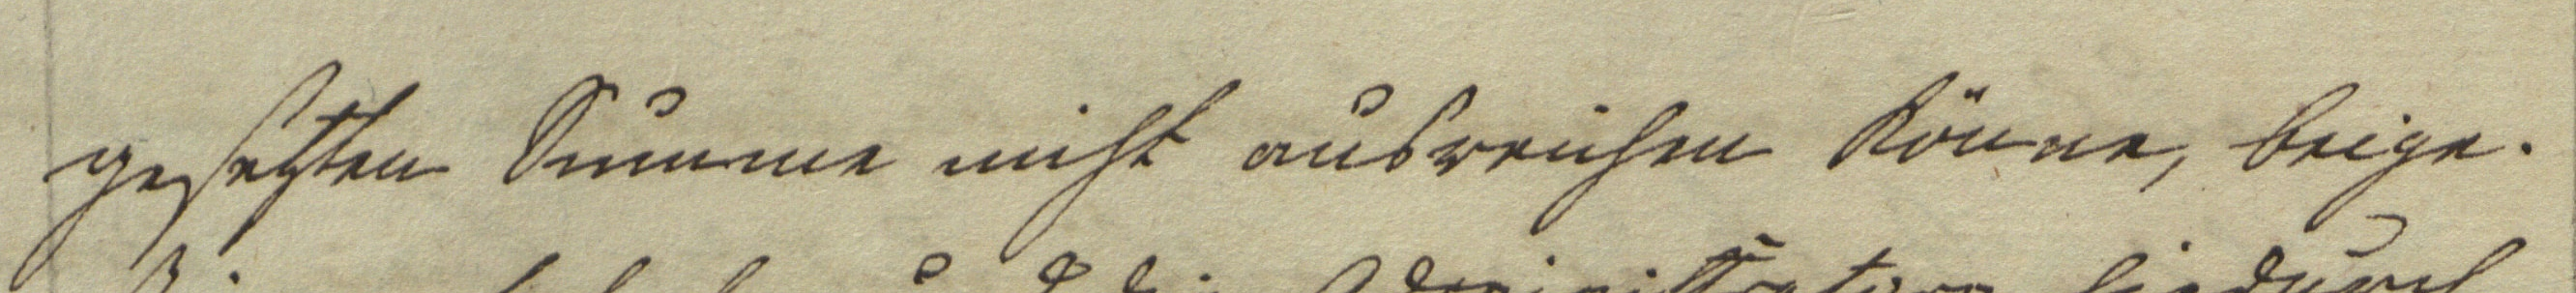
gesetzten Summe nicht ausreichen könne, beige¬
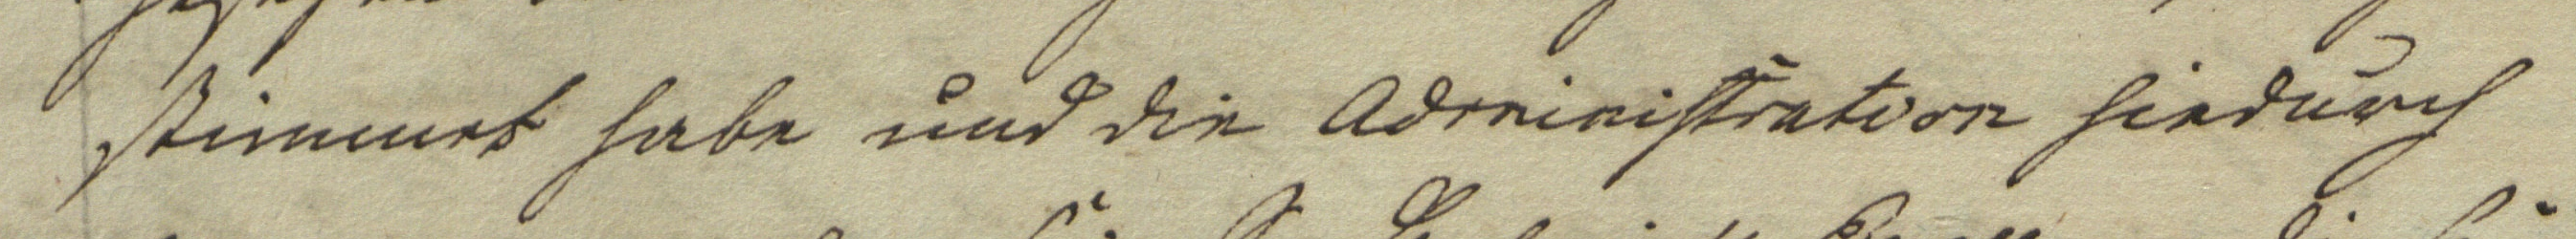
stimmt habe und die Administration hiedurch
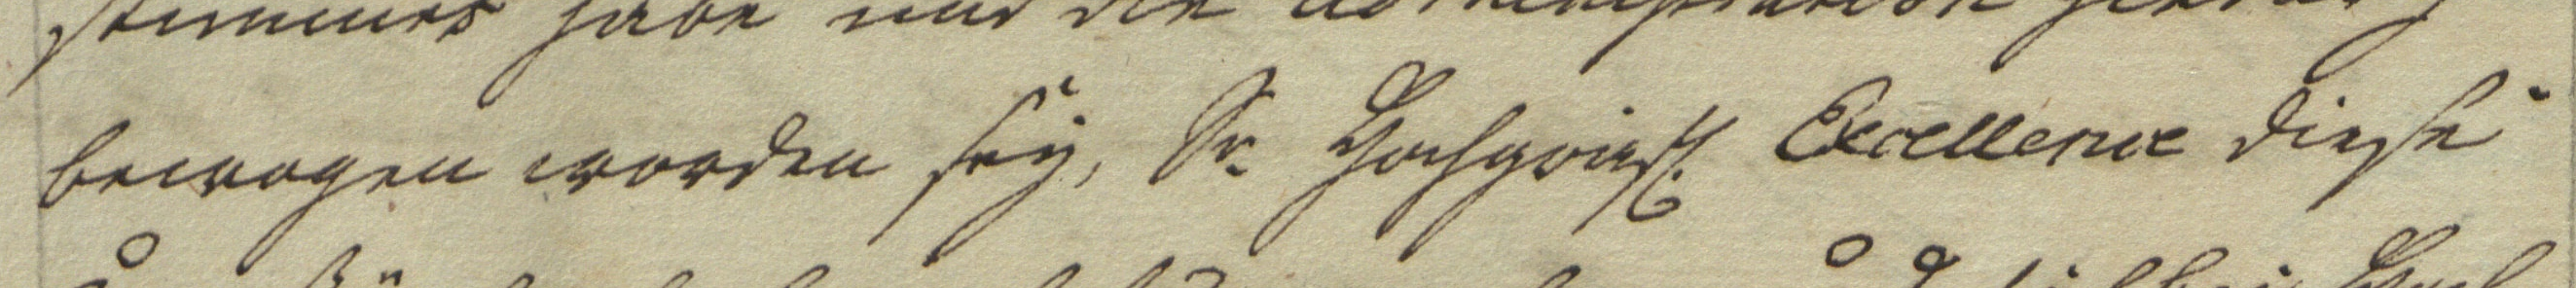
bewogen worden seÿ, Sr Hochgräfl. Excellence diese
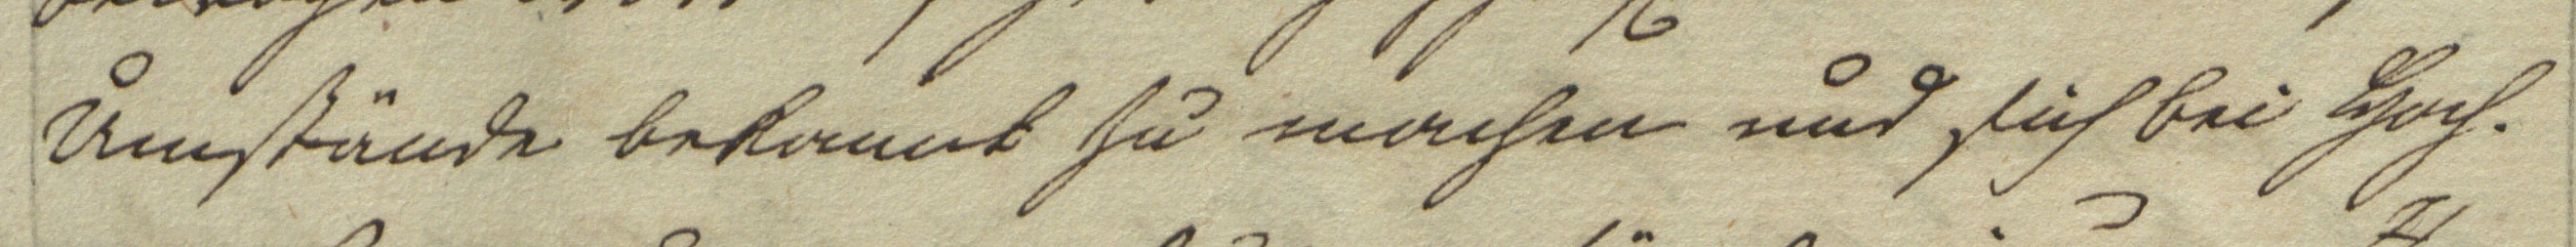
Umstände bekannt zu machen und sich bei Hoch¬
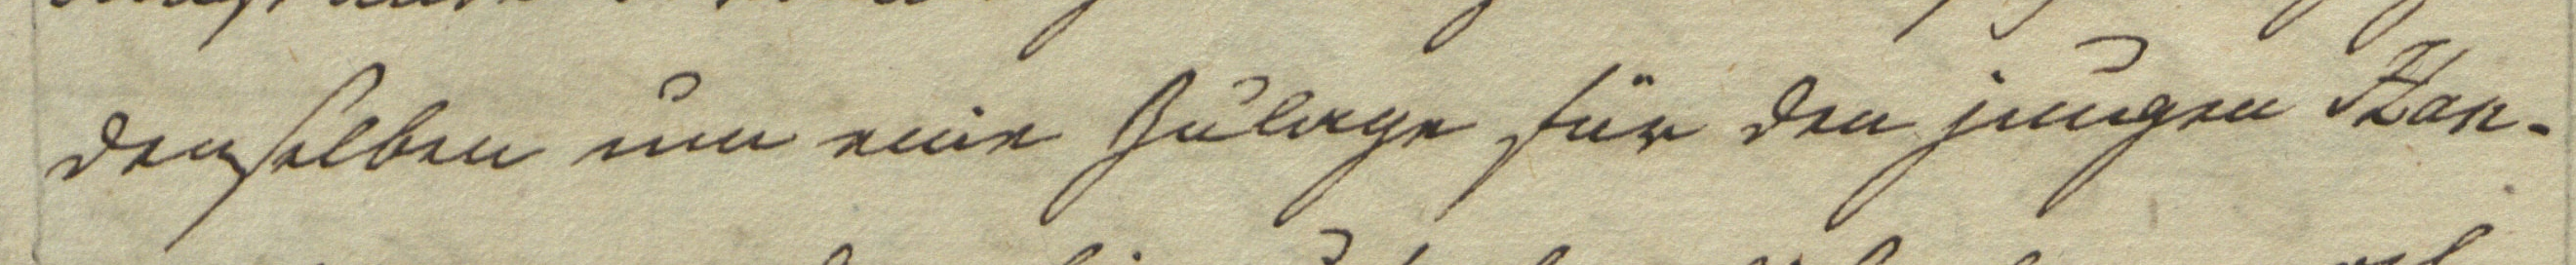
denselben um eine Zulage für den jungen Han¬
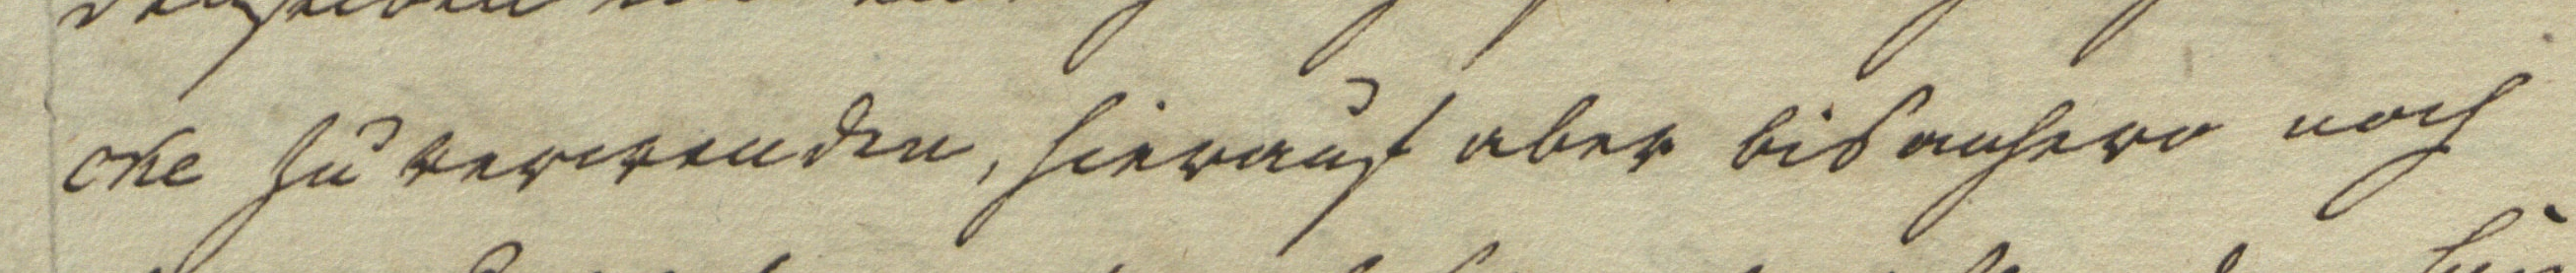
cke zu verwenden, hierauf aber bis anhero noch
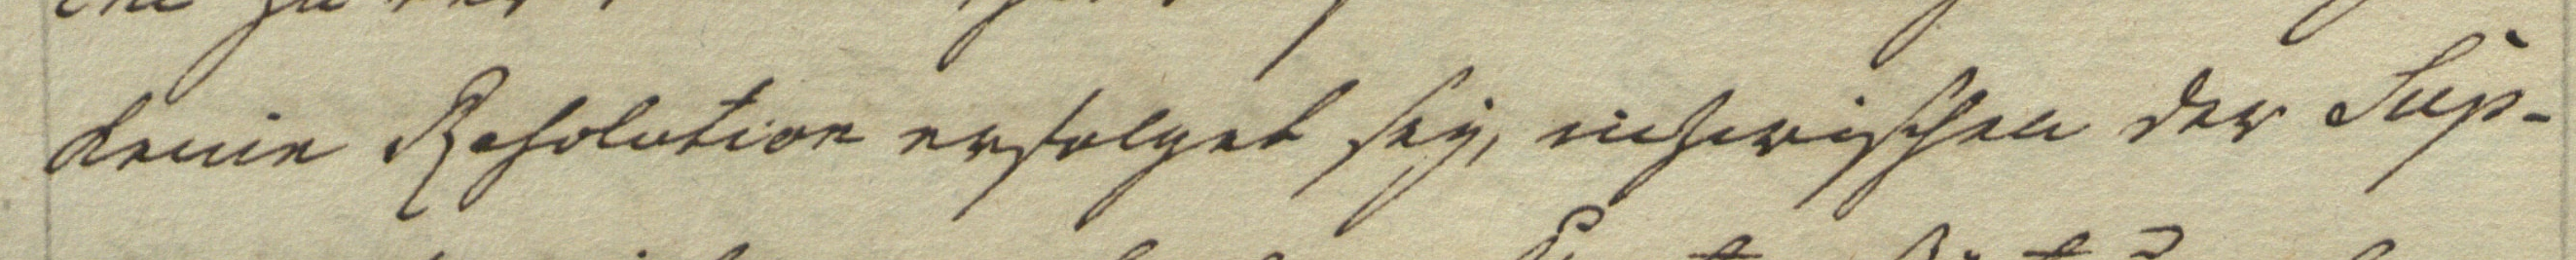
keine Resolution erfolget seÿ, inzwischen der Sup¬
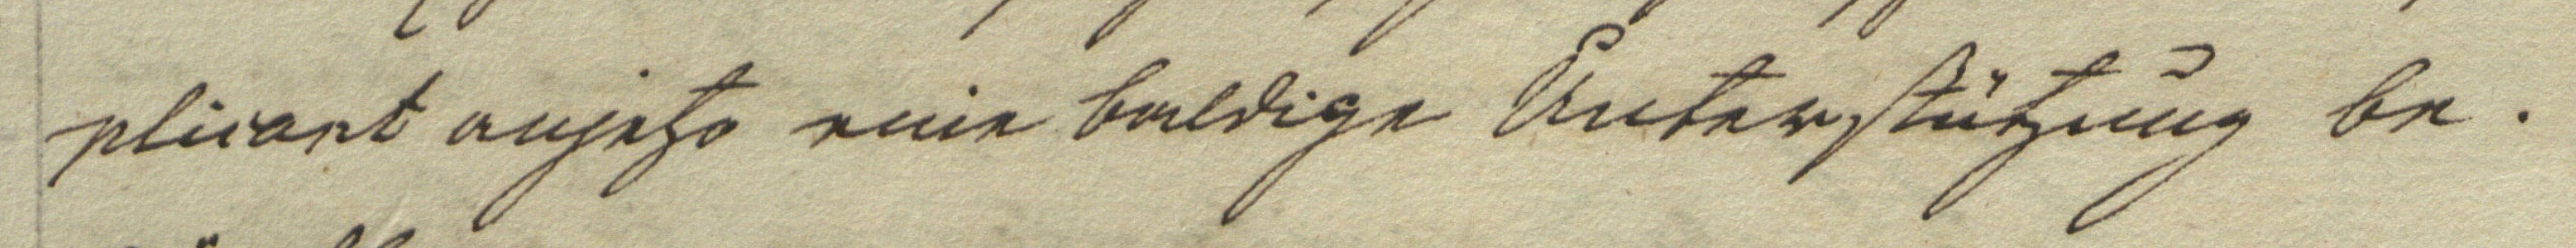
plicant anjetzo eine baldige Unterstützung be¬
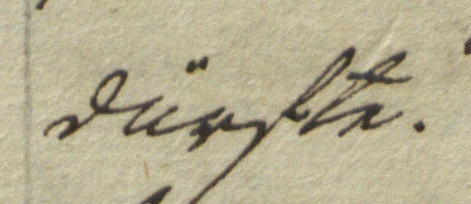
dürfte.
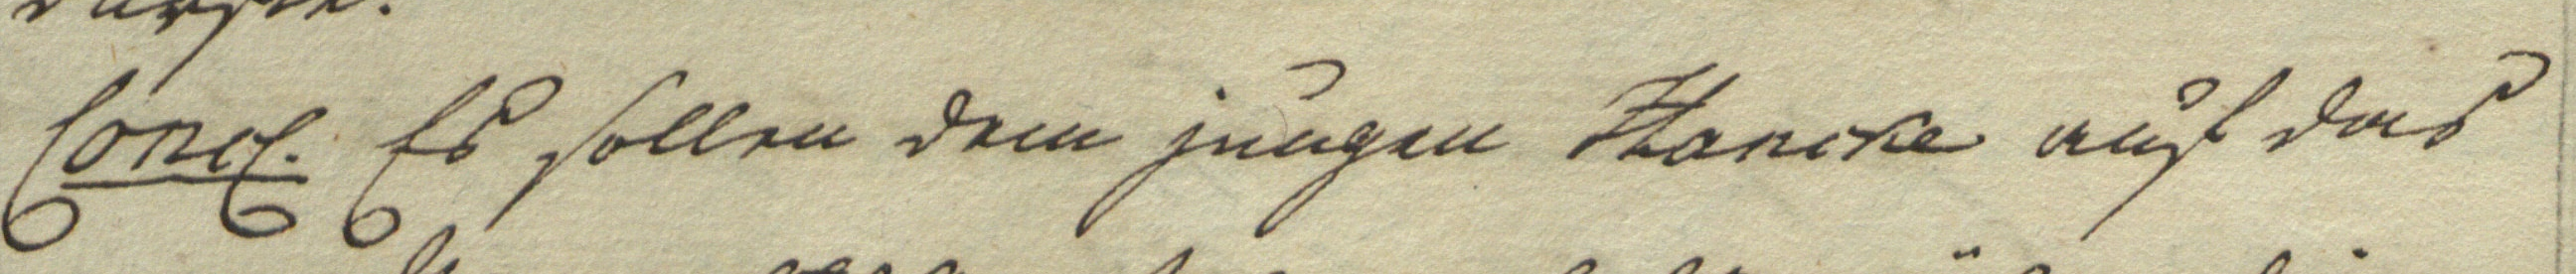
Concl. Es sollen dem jungen Hancke auf das
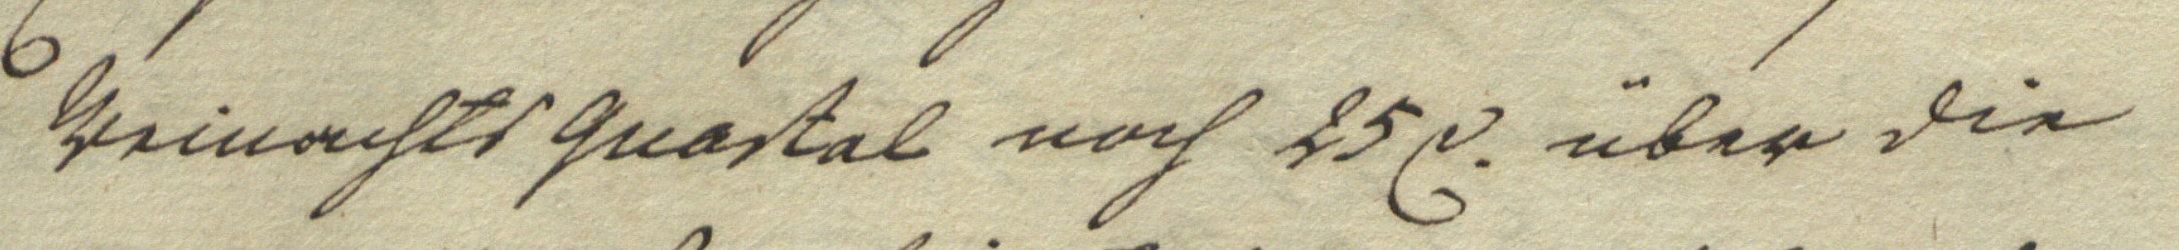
Weinachts Quartale noch 25 l. über die
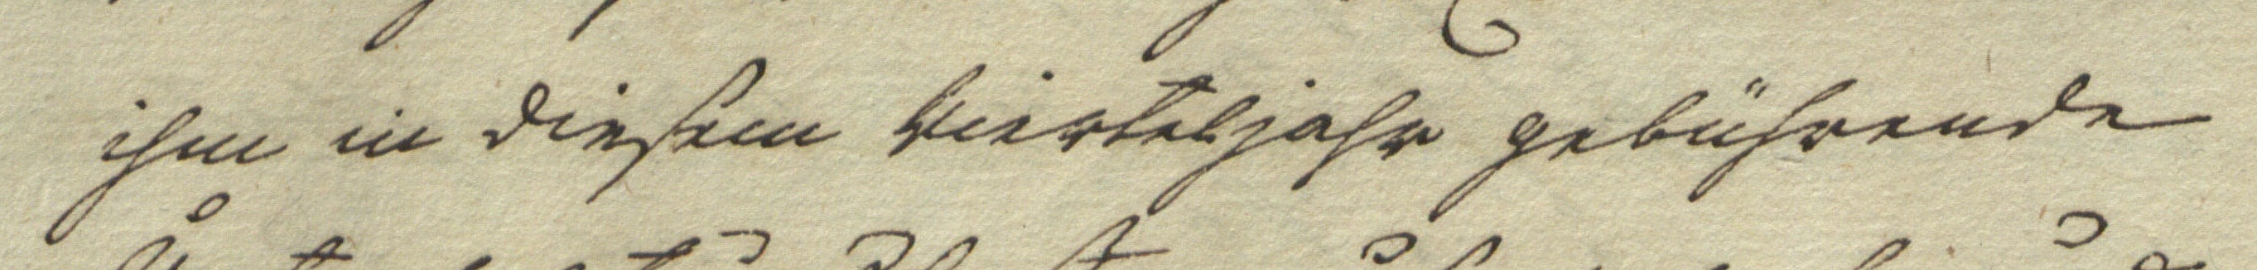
ihm in diesem Vierteljahr gebührende
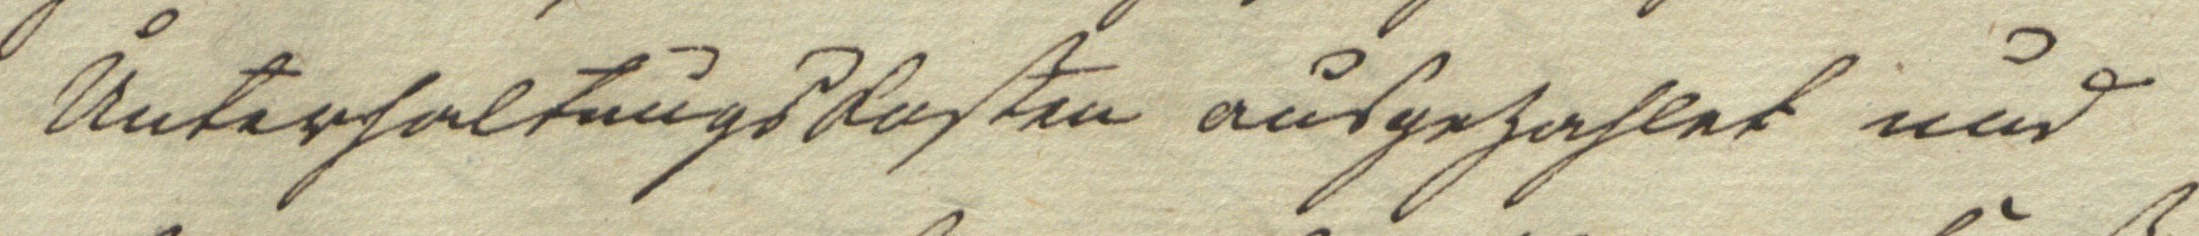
Unterhaltungs Kosten ausgezahlet und
